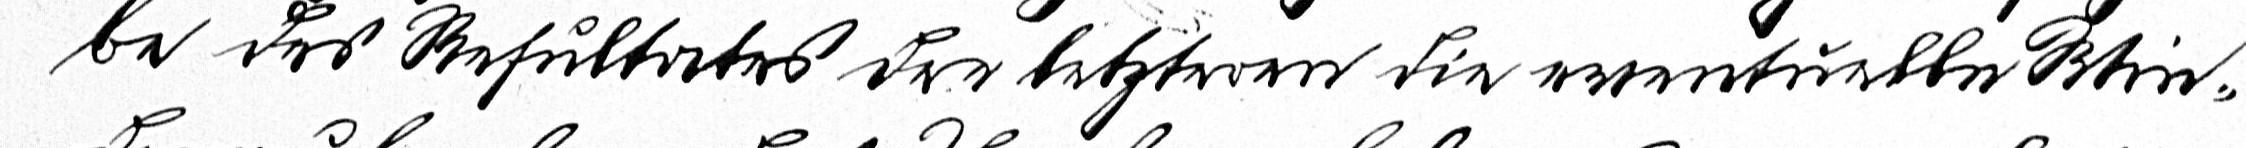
be des Resultates der letzteren die eventuelle Win¬
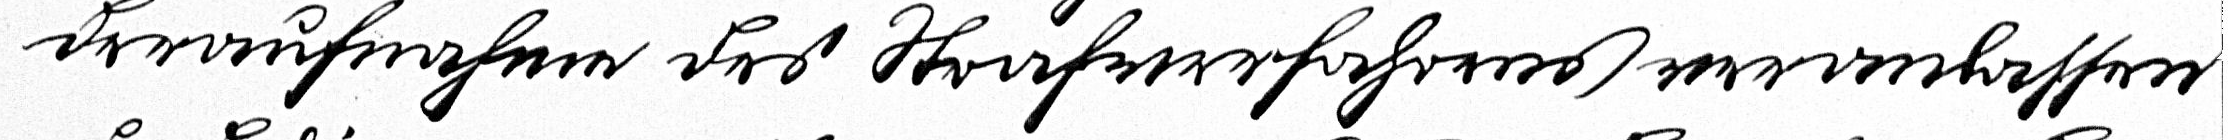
deraufnahme des Strafverfahrens veranlassen
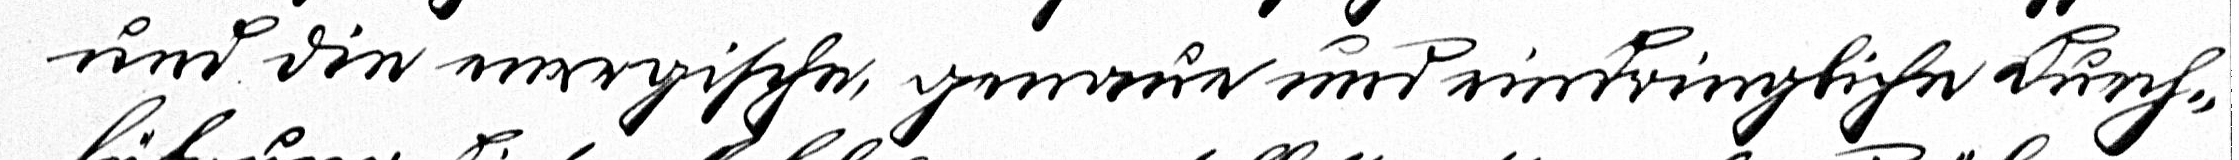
und die energische, genaue und eindringliche Durch¬
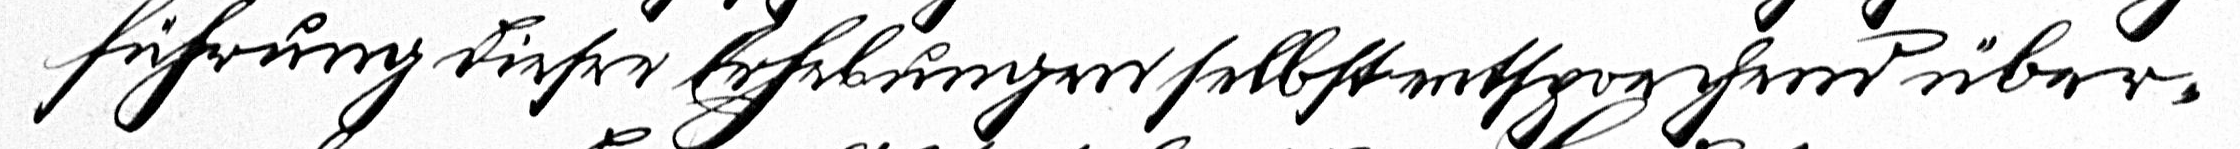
führung dieser Erhebungen selbstentsprechend über¬
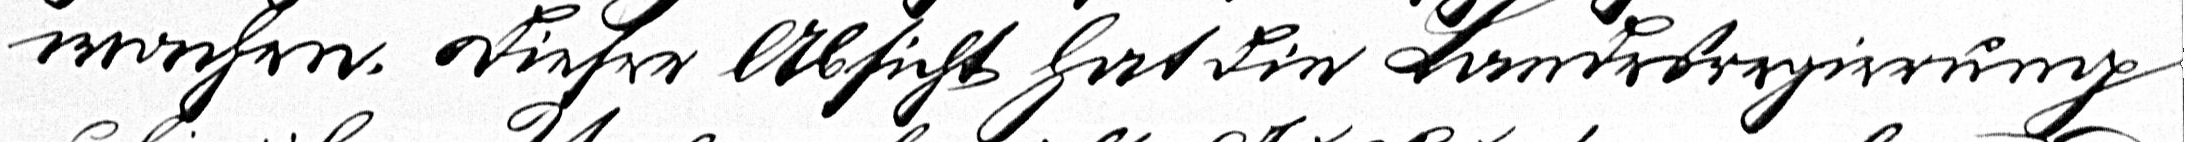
wachen. Dieser Absicht hat die Landesregierung
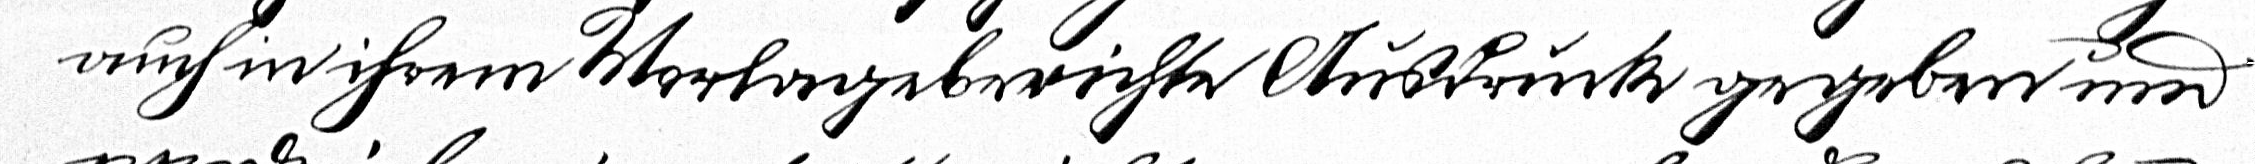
auch in ihrem Vorlageberichte Ausdruck gegeben und
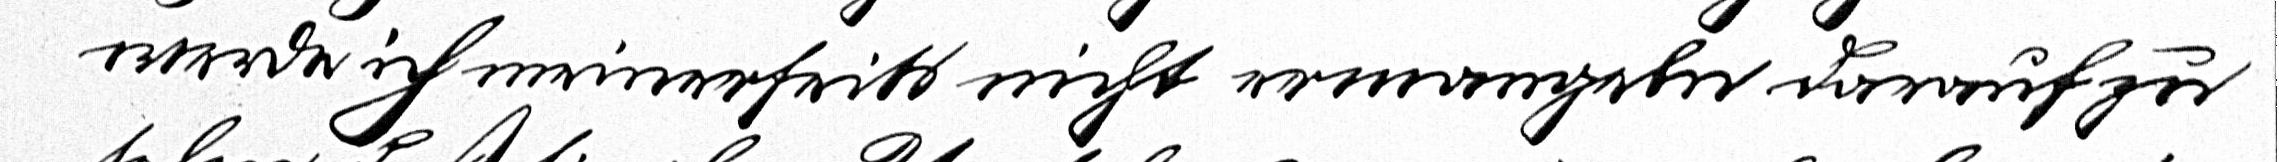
werde ich meinerseits nicht ermangeln darauf zu
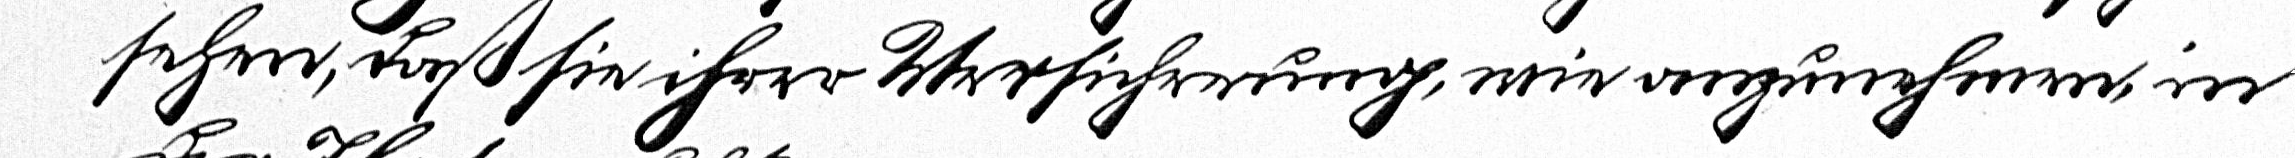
sehen, daß sie ihrer Versicherung, wie anzunehmen, in
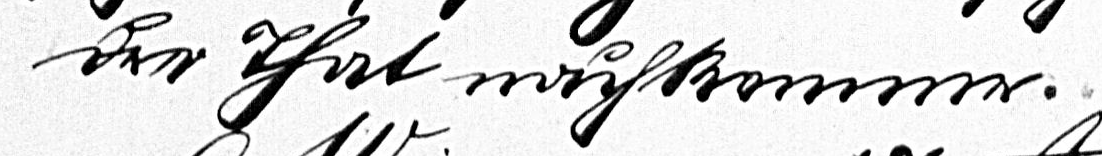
der That nachkomme.
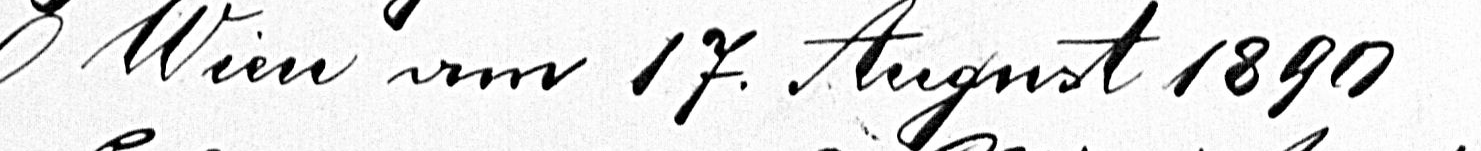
Wien am 17. August 1890
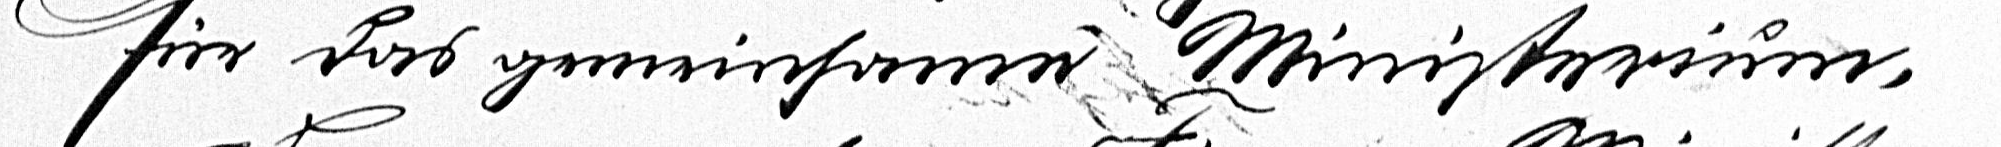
Für das gemeinsame Ministerium,
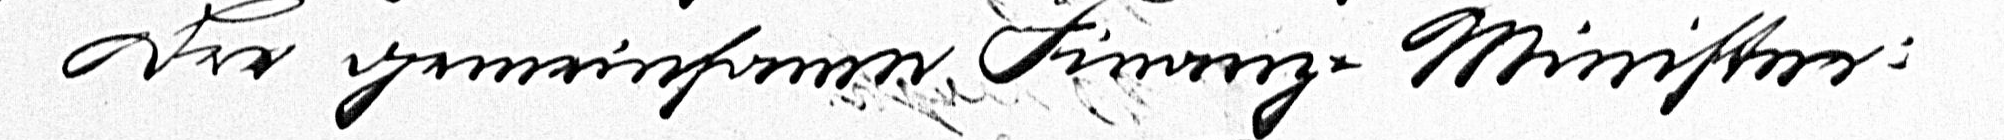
der gemeinsame Finanz-Minister:
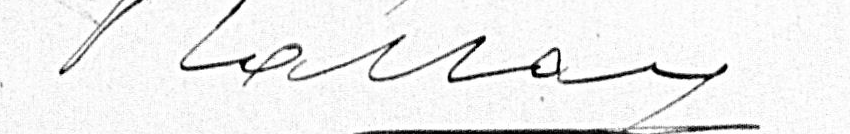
xx
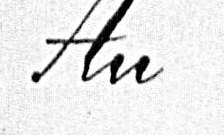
An
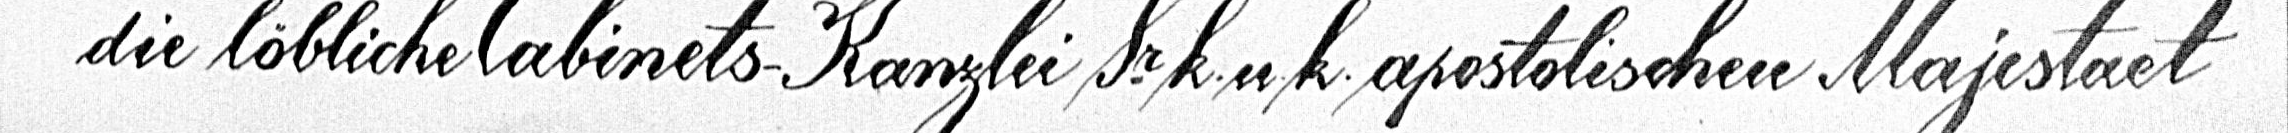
die löbliche Cabinets-Kanzlei Sr. k. u. k. apostolischen Majestaet
